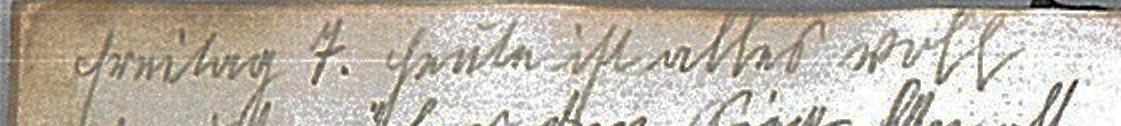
Freiatg 7. Heute ist alles voll
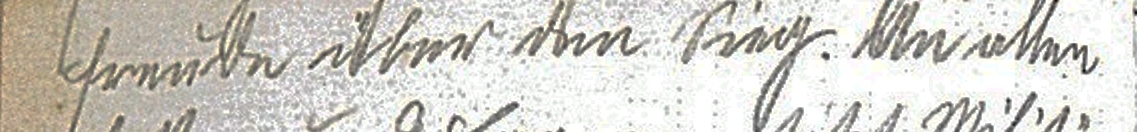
Freude über den Sieg. An allen
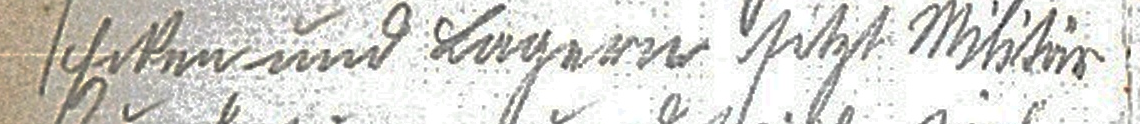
xy und Lagern sitzt Militär
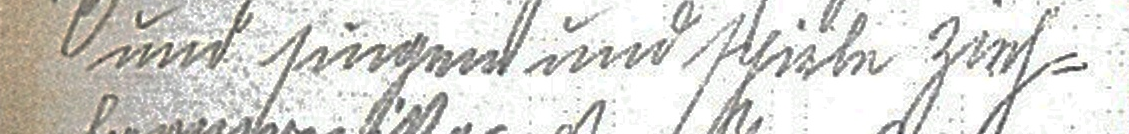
und singen und spielen Zieh-
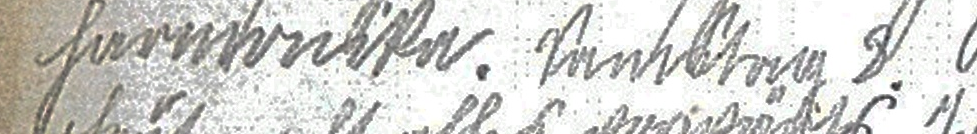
harmonika. Samstag 8.
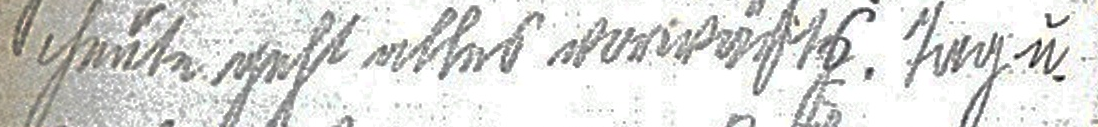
Heute geht alles vorwärts- Tag .
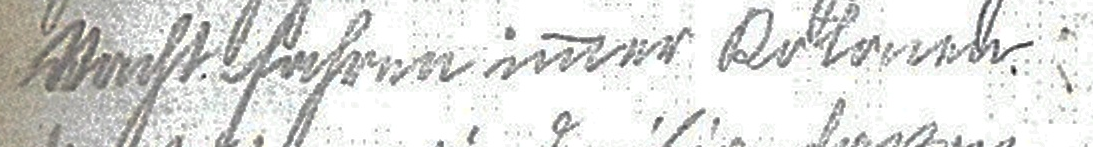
Nach fahren immer xy
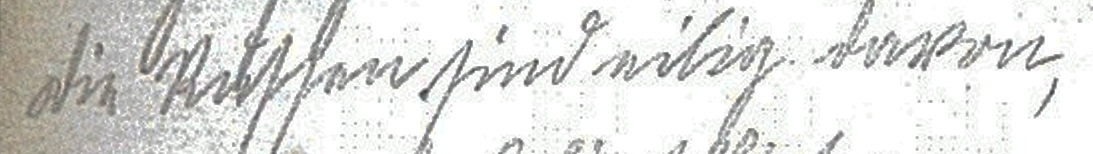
die Russen sind eilig davon,
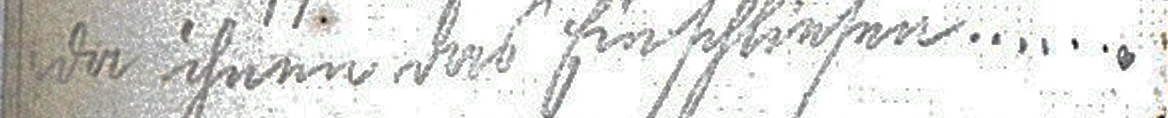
da ihnen das einschliesen ...
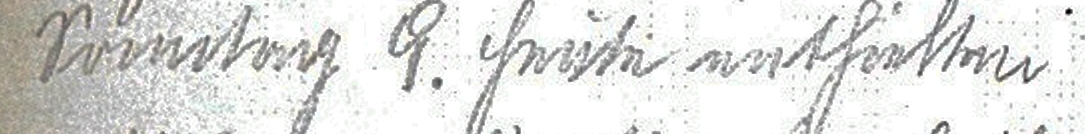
Sonntag 9. Heute enthalten
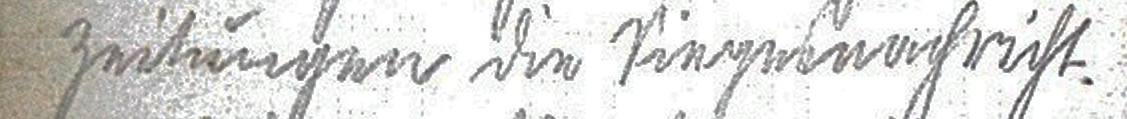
Zeitungen die Siegxyschrift
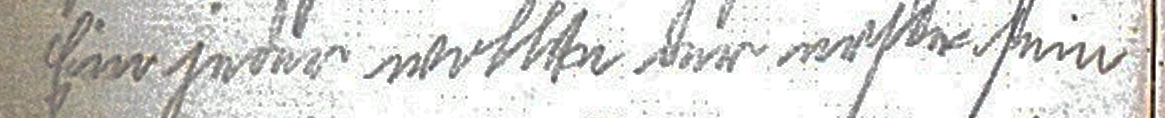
Ein jeder wollte der erste sein
